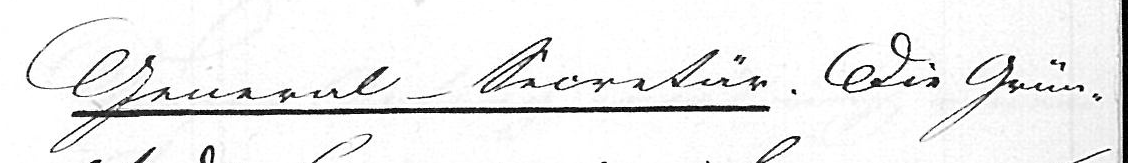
General-Secretär. Die Grün-
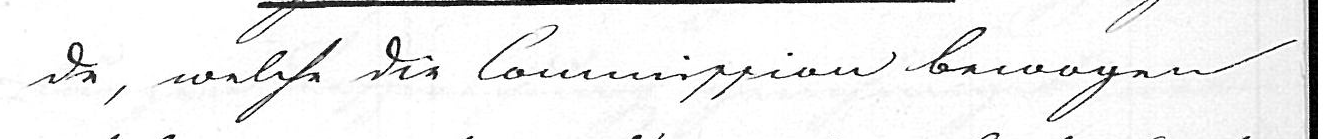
de, welche die Commission bewogen
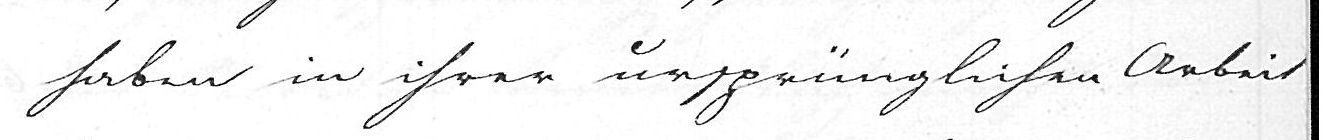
haben in ihrer ursprünglichen Arbeit
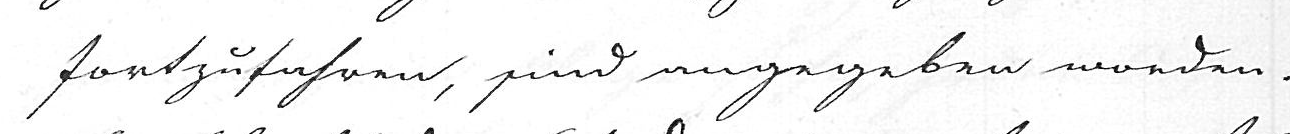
fortzufahren, sind angegeben worden.
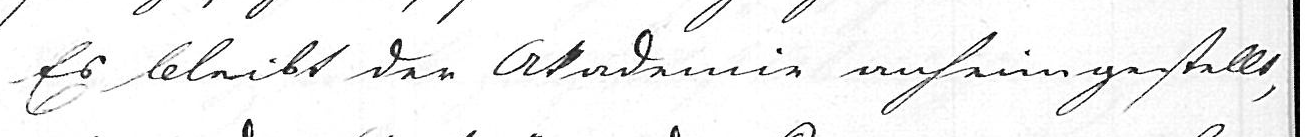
Es bleibt der Akademie anheimgestellt,
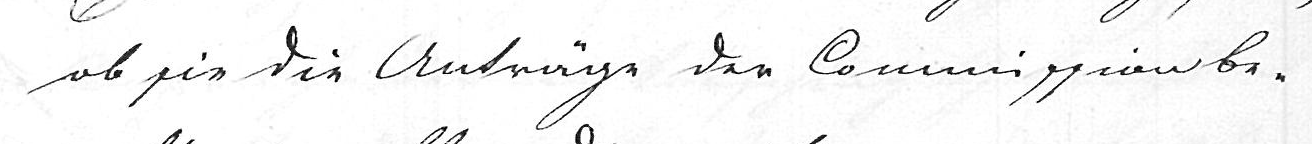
ob sie die Anträge der Commission be-
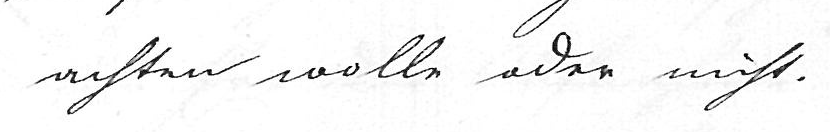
achten wolle oder nicht.
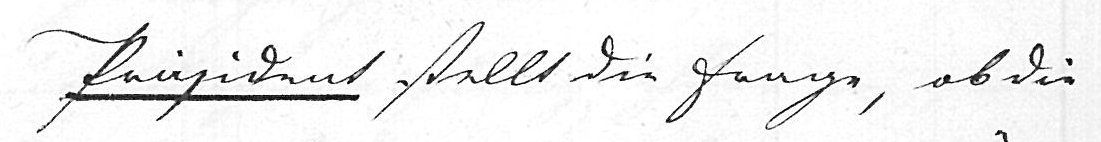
Präsident stellt die Frage, ob die
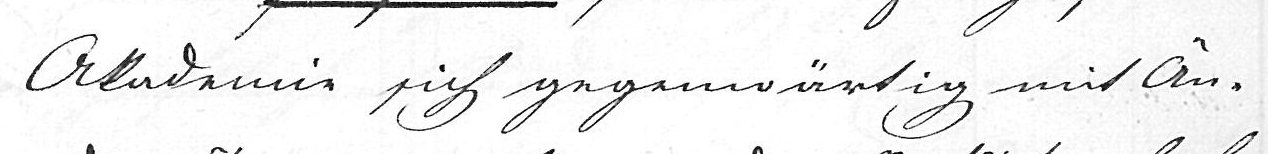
Akademie sich gegenwärtig mit Än-
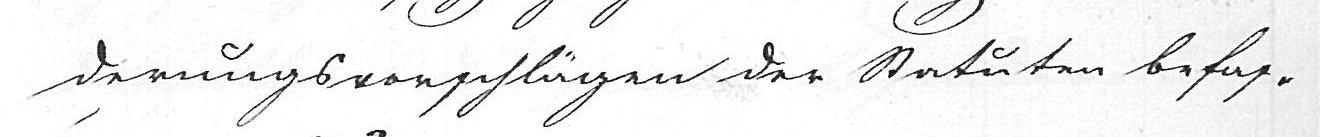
derungsvorschlägen der Statuten befas-
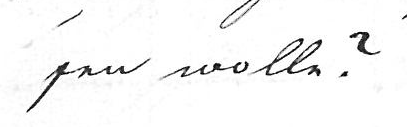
sen wolle?
